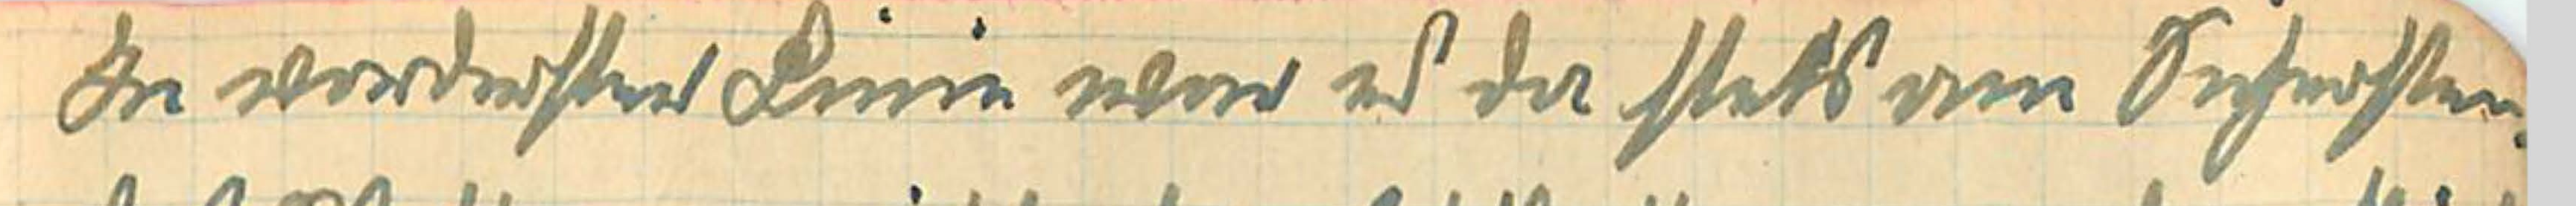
In vorderster Linie war es da stets am Schwersten.
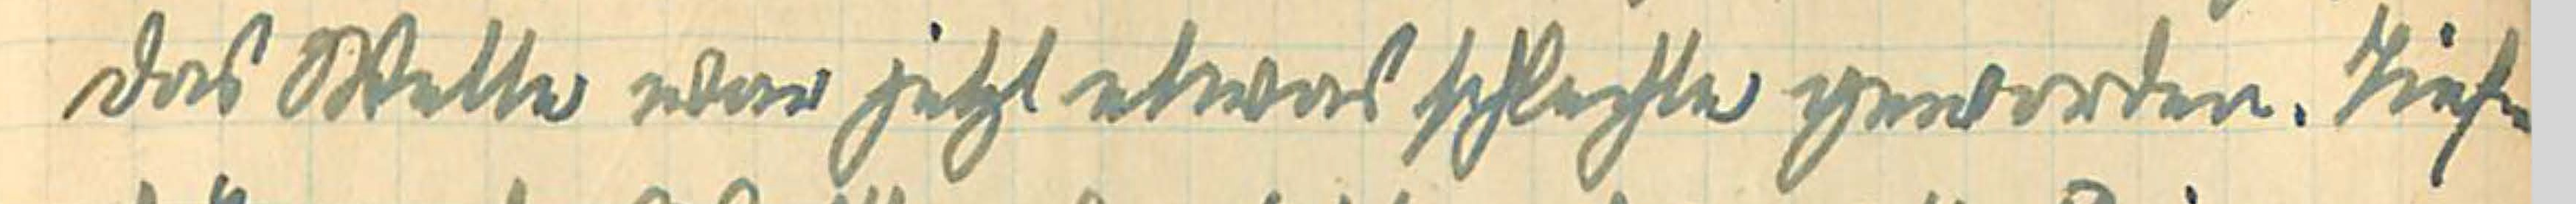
Das Wetter war jetzt etwas schlechter geworden. Tiefer
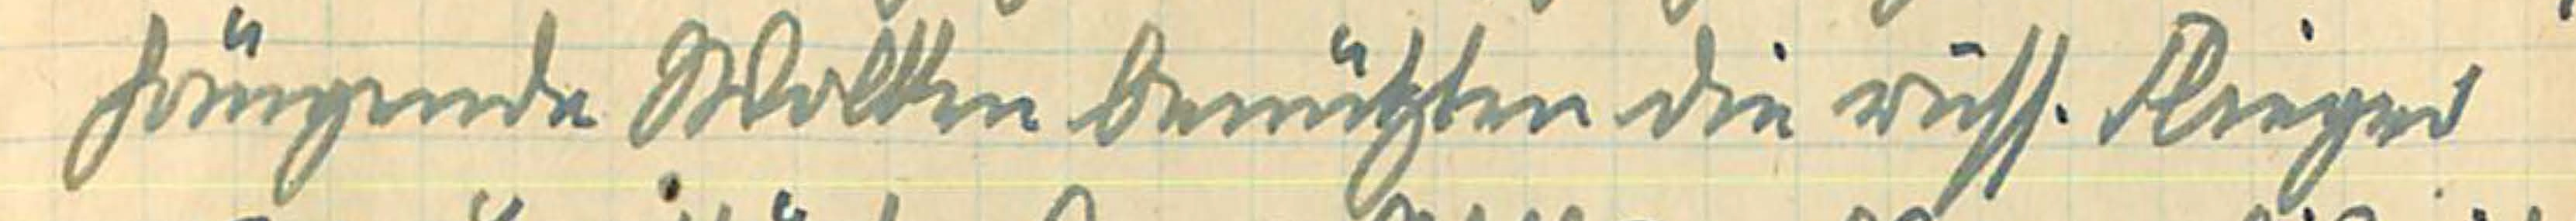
hängende Wolken benützten die russ. Flieger
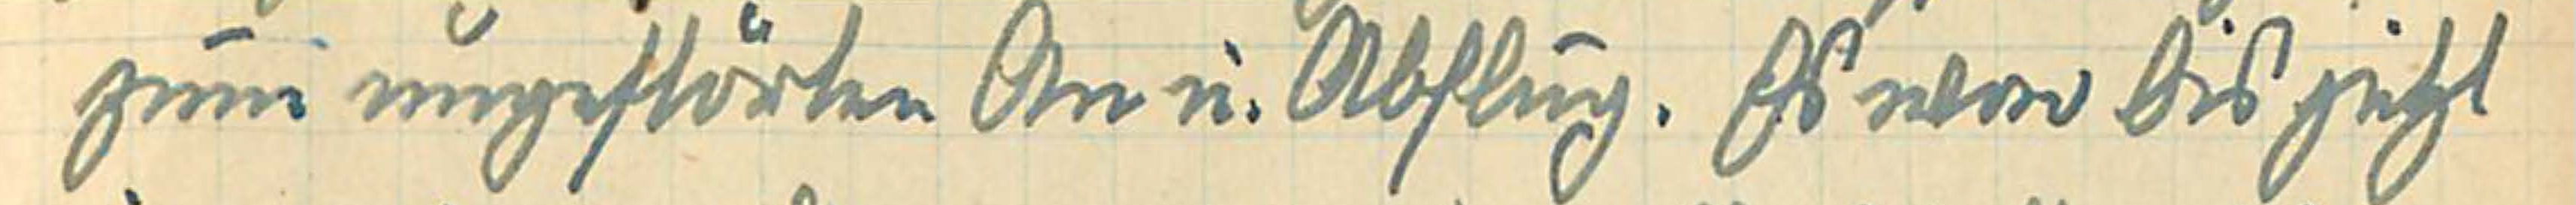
zum ungestörten An u. Abflug. Es war bis jetzt
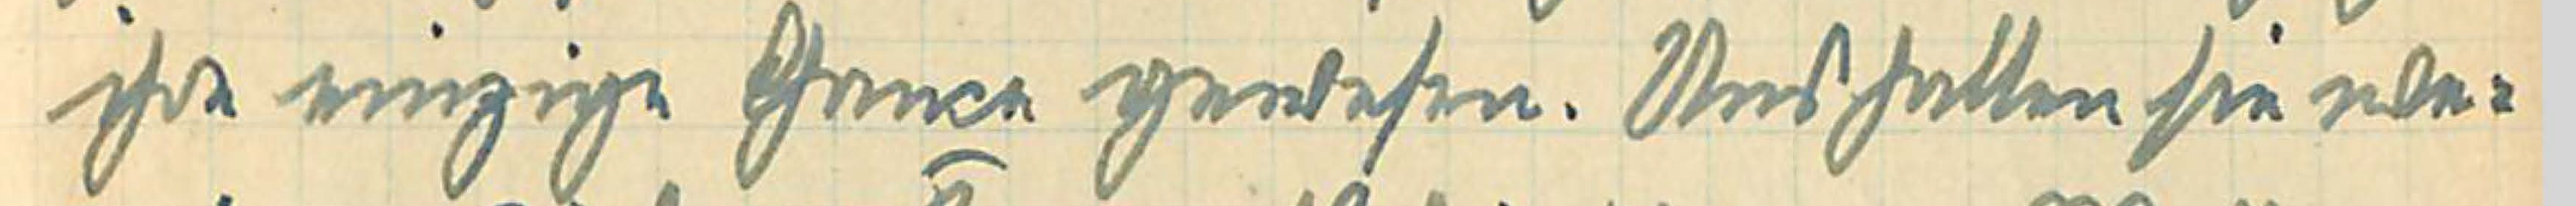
ihre einzige Chance gewesen. Uns hatten sie we-
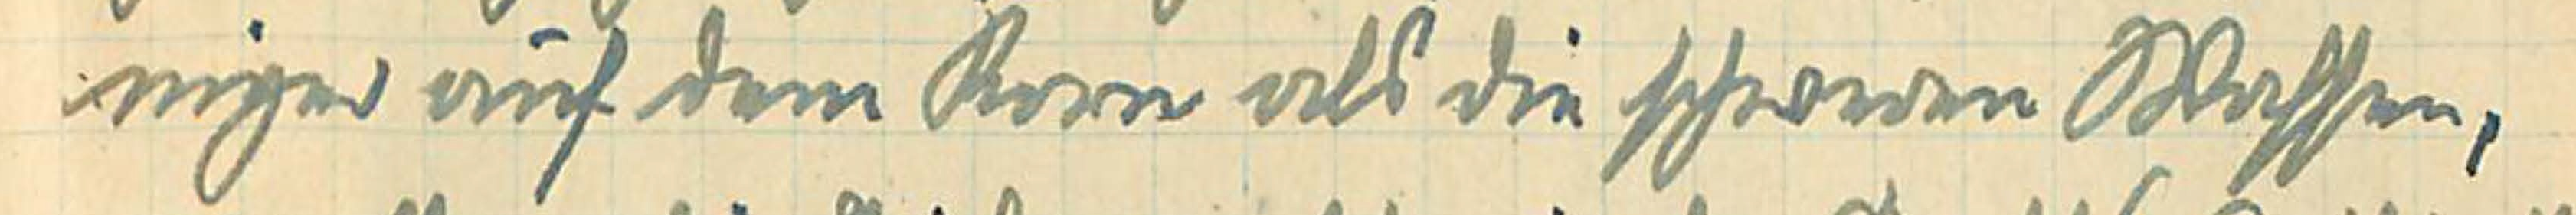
niger auf dem Korn als die schweren Waffen,
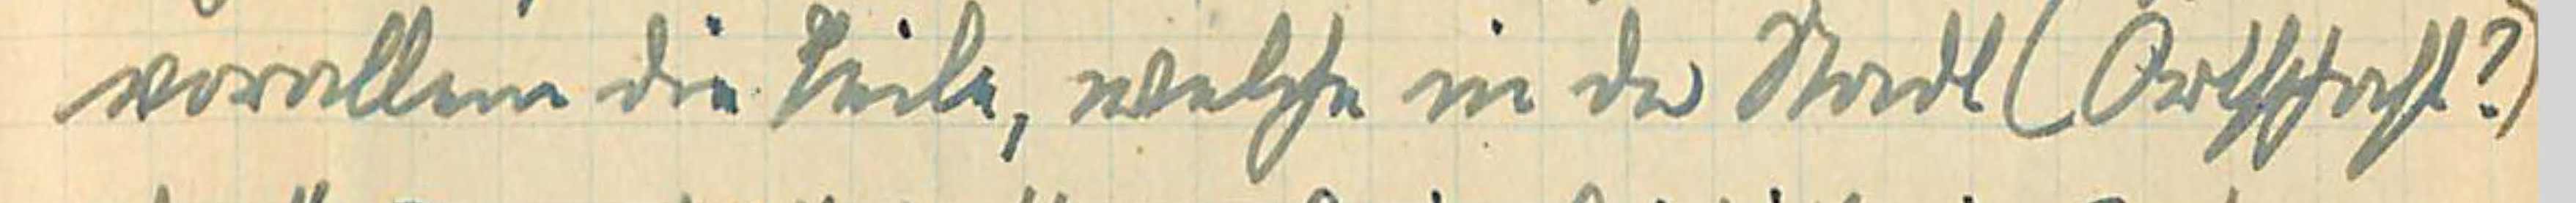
vorallem die Teile, welche in der Stadt (Ortschaft?)
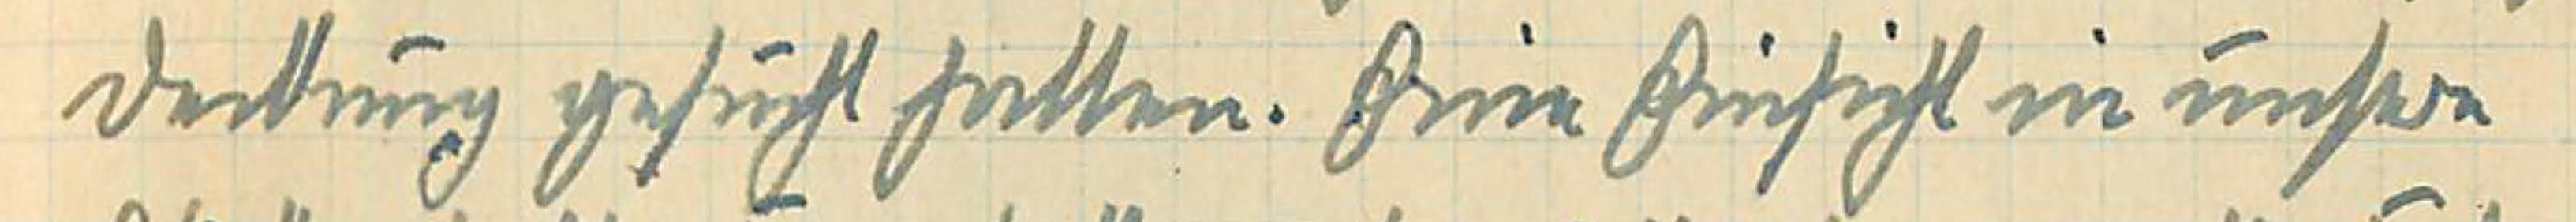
Deckung gesucht hatten. Eine Einsicht in unsere
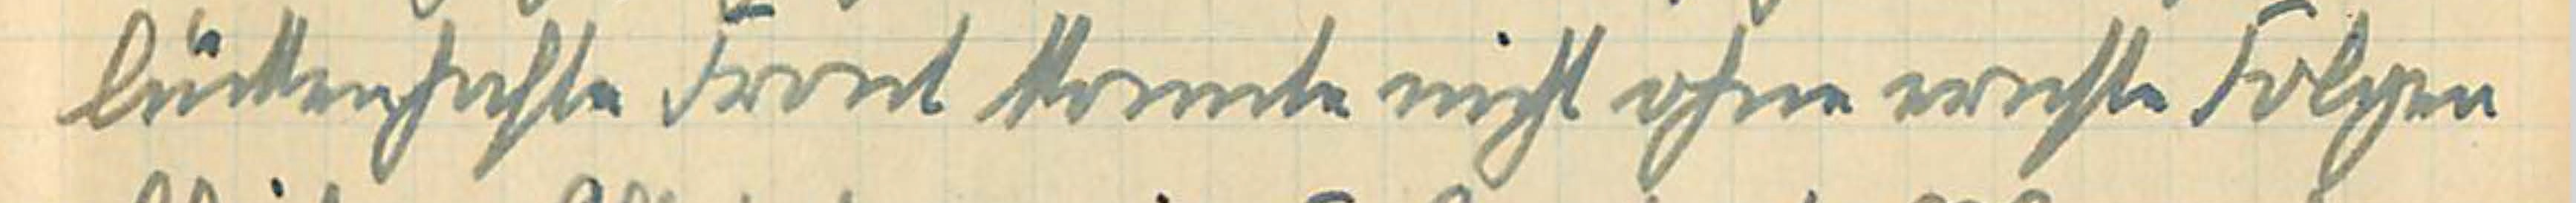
lückenhafte Front konnte nicht ohne ernsthafte Folgen
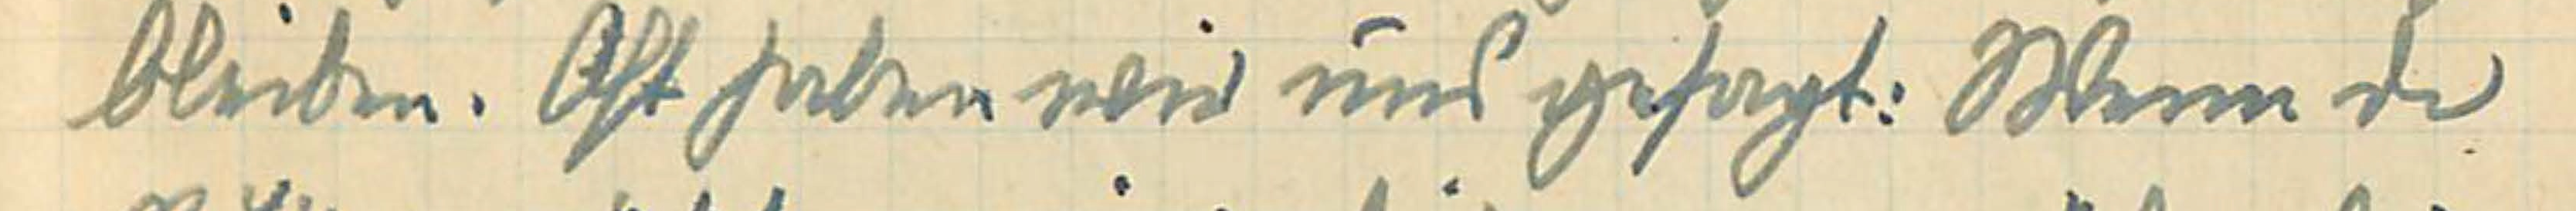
bleiben. Oft haben wir uns gesagt: Wenn der
